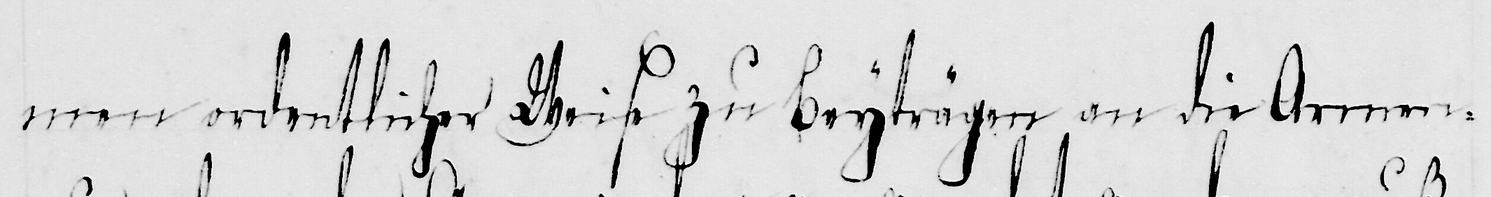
men ordentlicher Weise zu Beyträgen an die Armen¬
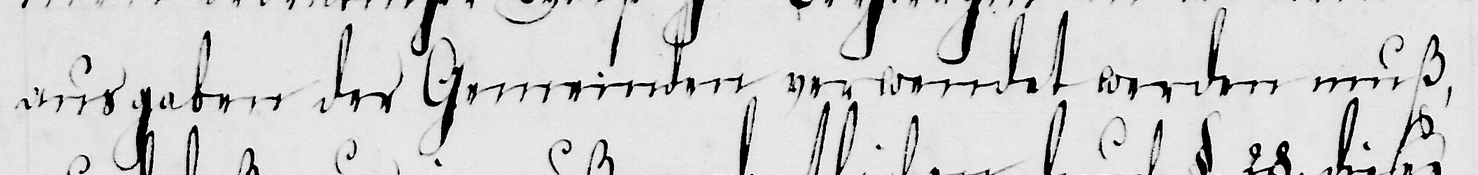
ausgaben der Gemeinden verwendet werden muß,
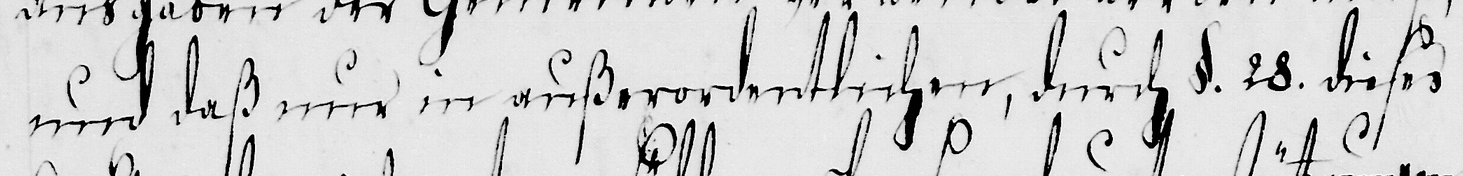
und daß nur in außerordentlichen, durch §. 28. dieses
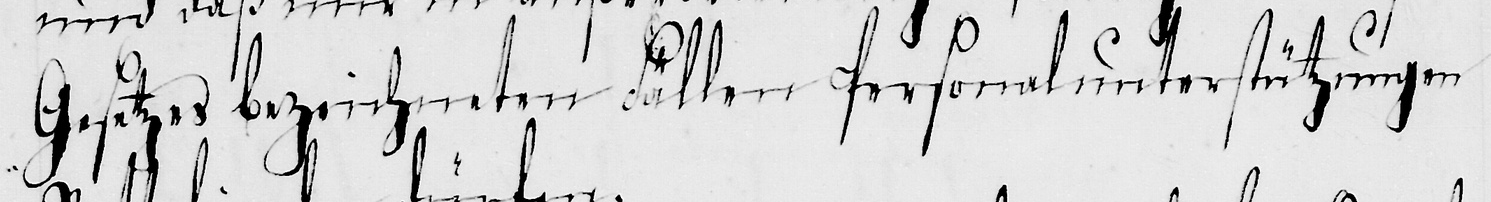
Gesetzes bezeichneten Fällen Personalunterstützungen
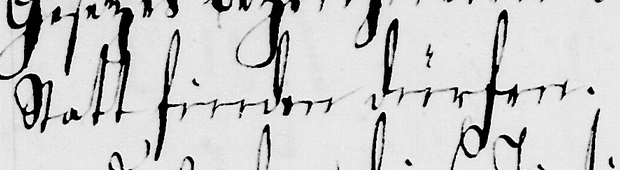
Statt finden dürfen.
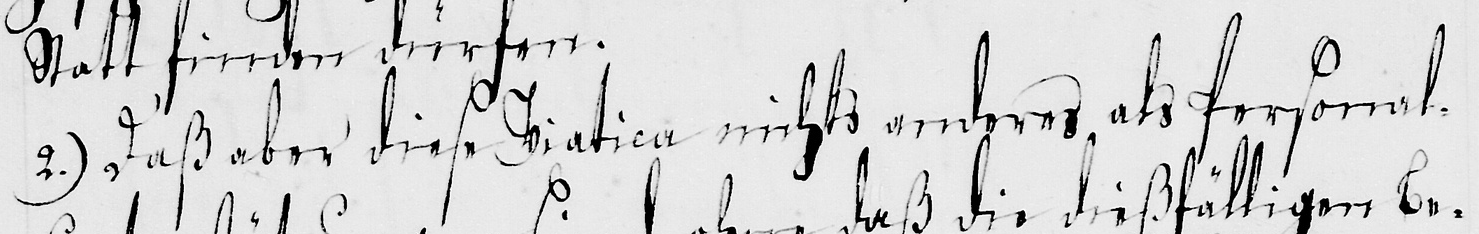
2.) Daß aber diese Viatica nichts anderes, als Personal¬
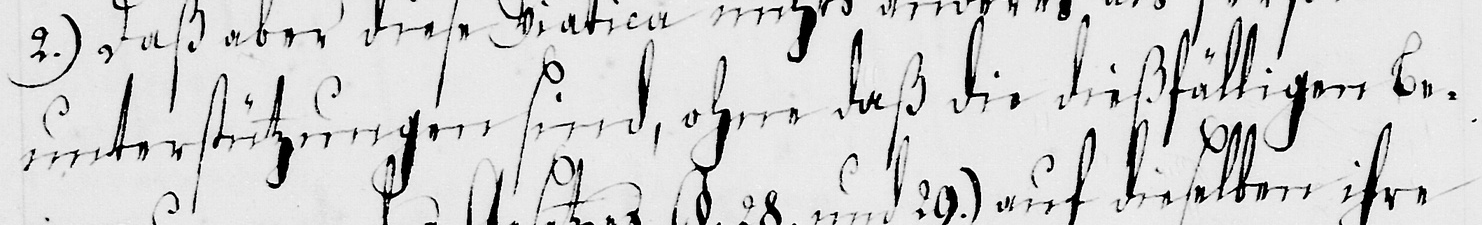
unterstützungen sind, ohne daß die dießfälligen Be¬
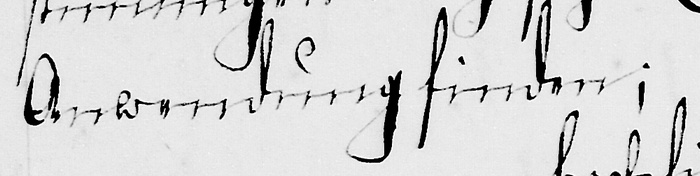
Anwendung finden;
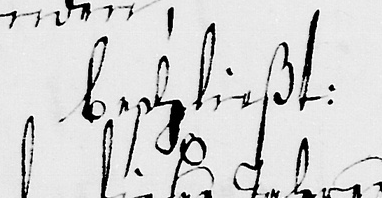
beschließt:
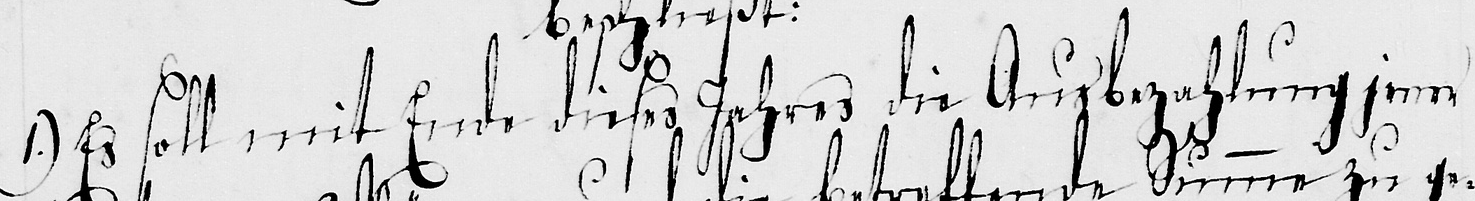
Es soll mit Ende dieses Jahres die Ausbezahlung jener
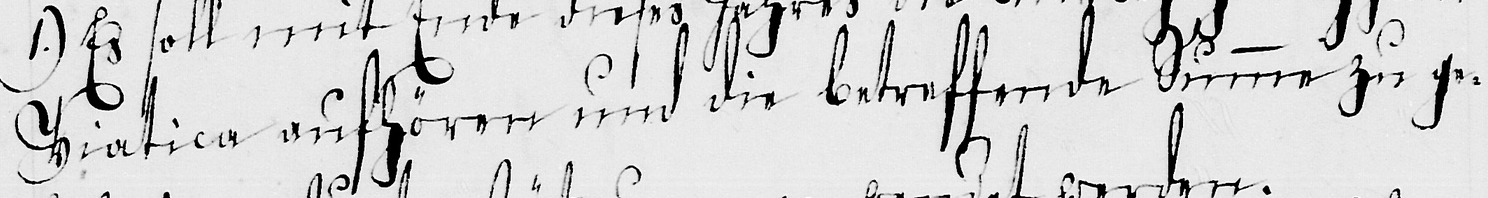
Viatica aufhören und die betreffende Summe zu ge¬
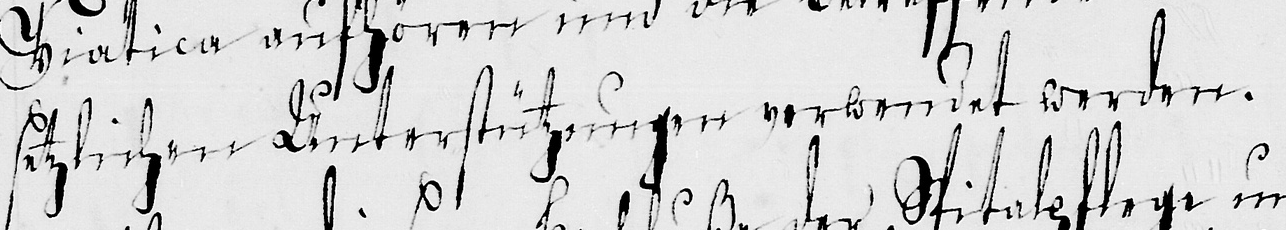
setzlichen Unterstützungen verwendet werden.
